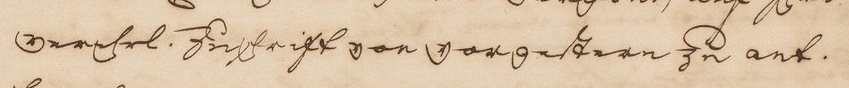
verehrl. Zuschrift von vorgestern zu ant-
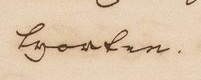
worten.
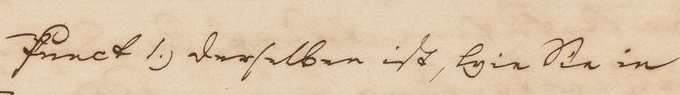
Punct 1.) derselben ist, wie Sie in
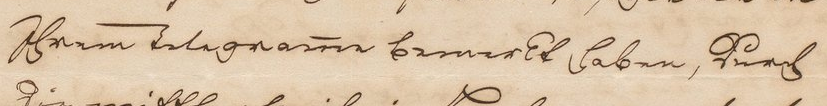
Ihrem Telegramm bemerkt haben, durch
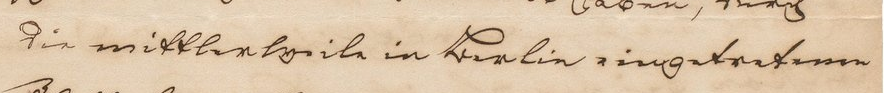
die mittlerweile in Berlin eingetretenen
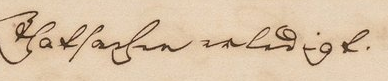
Thatsachen erledigt.
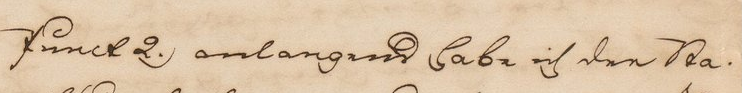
Punct 2.) anlangend habe ich den Sta-
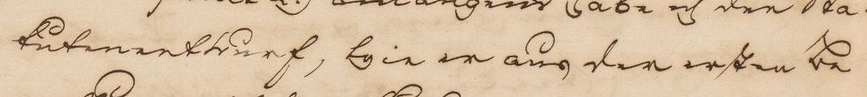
tutenentwurf, wie er aus der ersten Be-
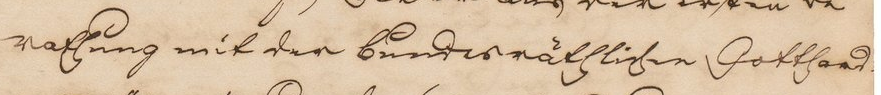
ratung mit der bundesräthlichen Gotthard -
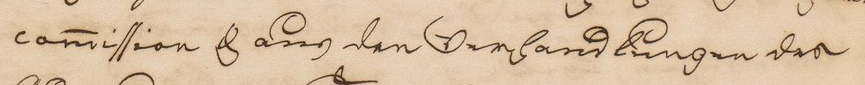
commission & aus den Verhandlungen des
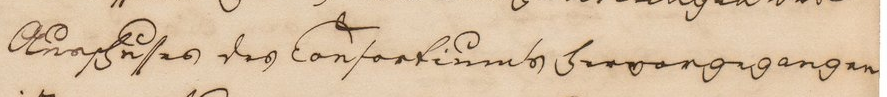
Ausschusses des Consortium's hervorgegangen
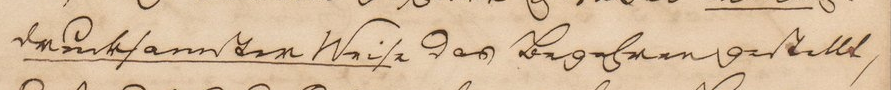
drucksamster Weise das Begehren gestellt,
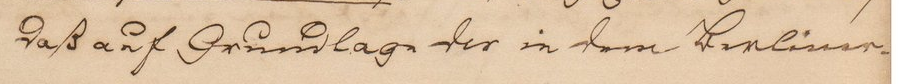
daß auf Grundlage der in dem Berliner -
